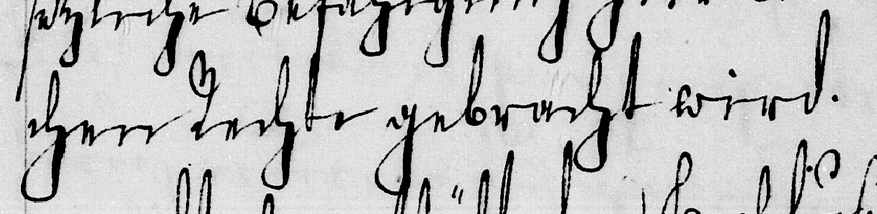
chen Rechte gebracht wird.
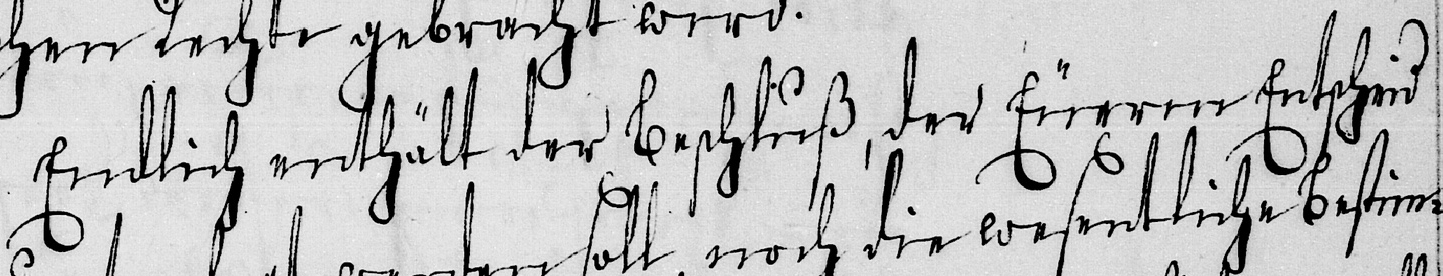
Endlich enthält der Beschluß, der Euerm Entscheid
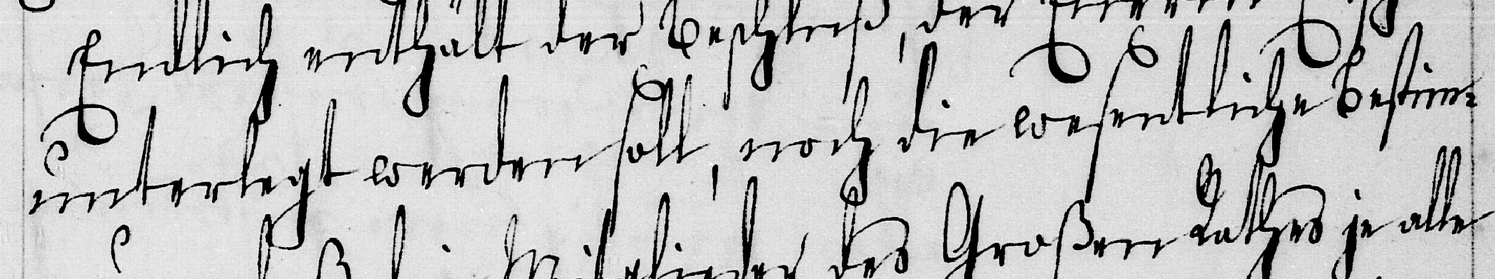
unterlegt werden soll, noch die wesentliche Best¬
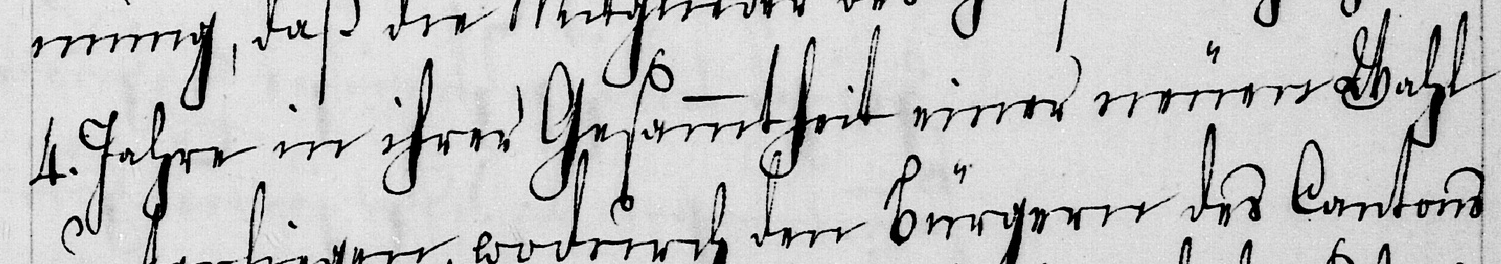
4. Jahre in ihrer Gesammtheit einer neuen Wahl
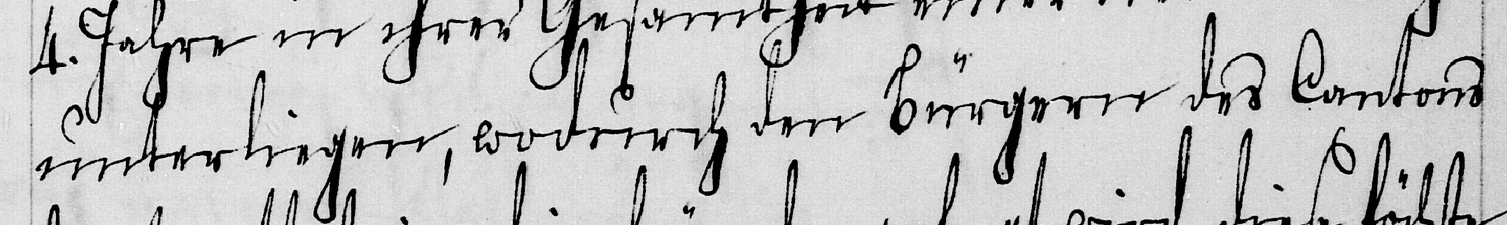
unterliegen, wodurch den Bürgern des Cantons
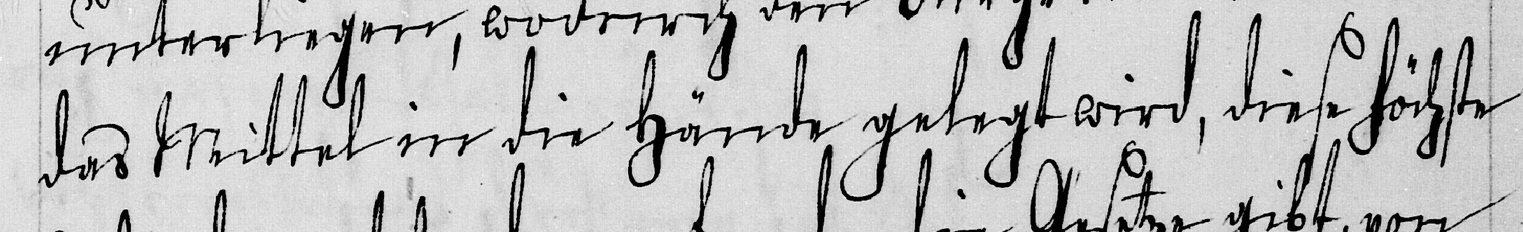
das Mittel in die Hände gelegt wird, diese Höchs¬
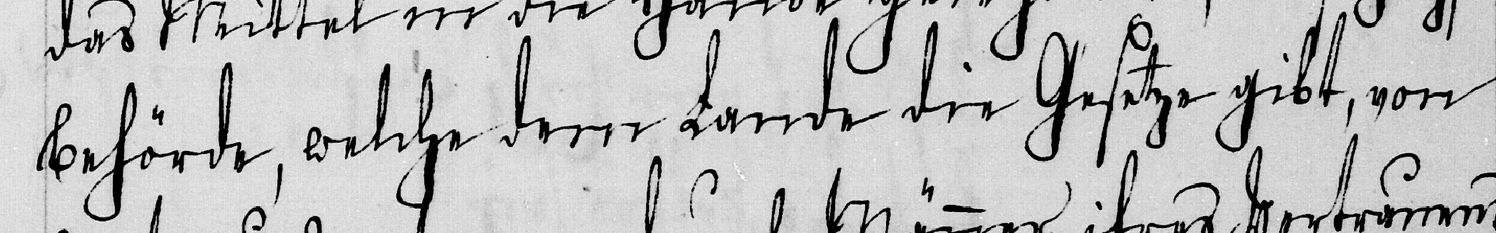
Behörde, welche dem Lande die Gesetze gibt, von
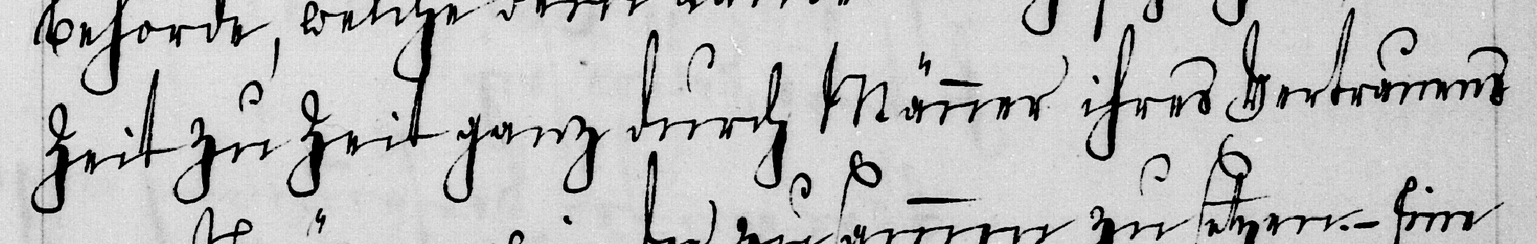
Zeit zu Zeit ganz durch Männer ihres Vertrauens
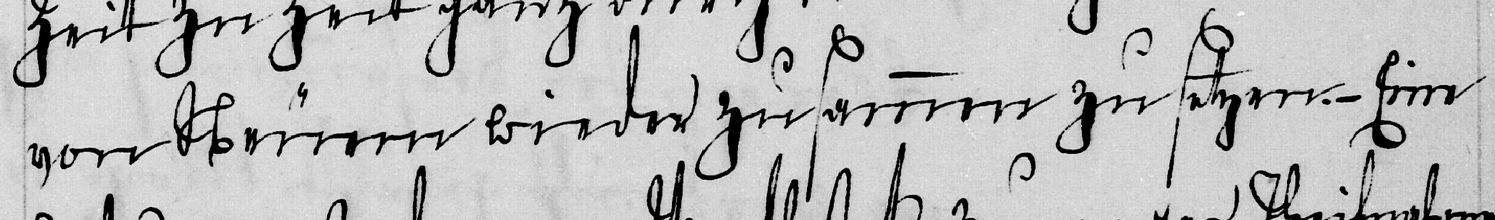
von Neuem wieder zusammen zu setzen. – Eine
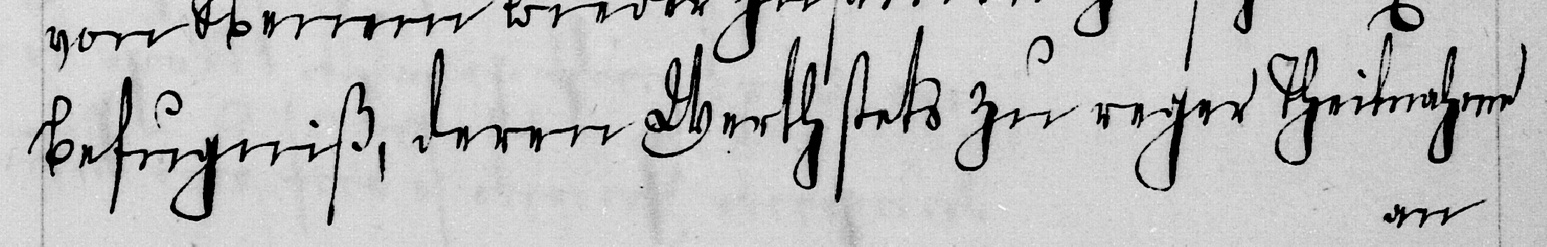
Befugniß, deren Werth stets zu reger Theilnahme
